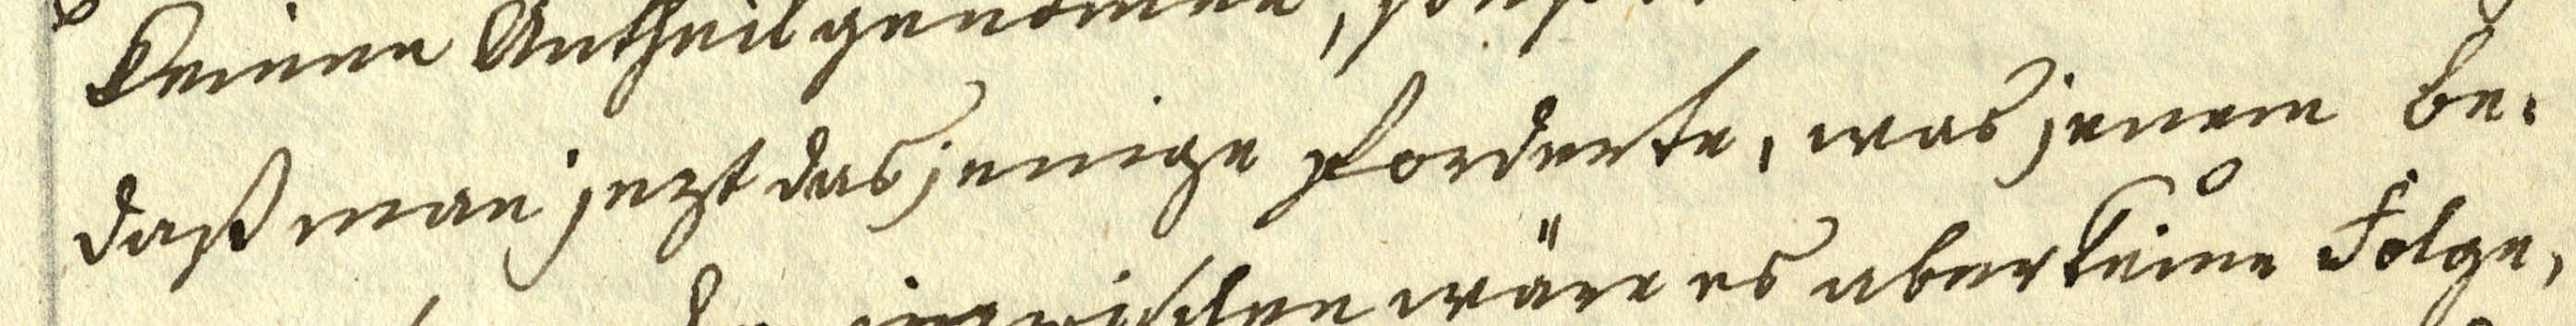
daß man jezt dasjenige forderte, was jenem be¬
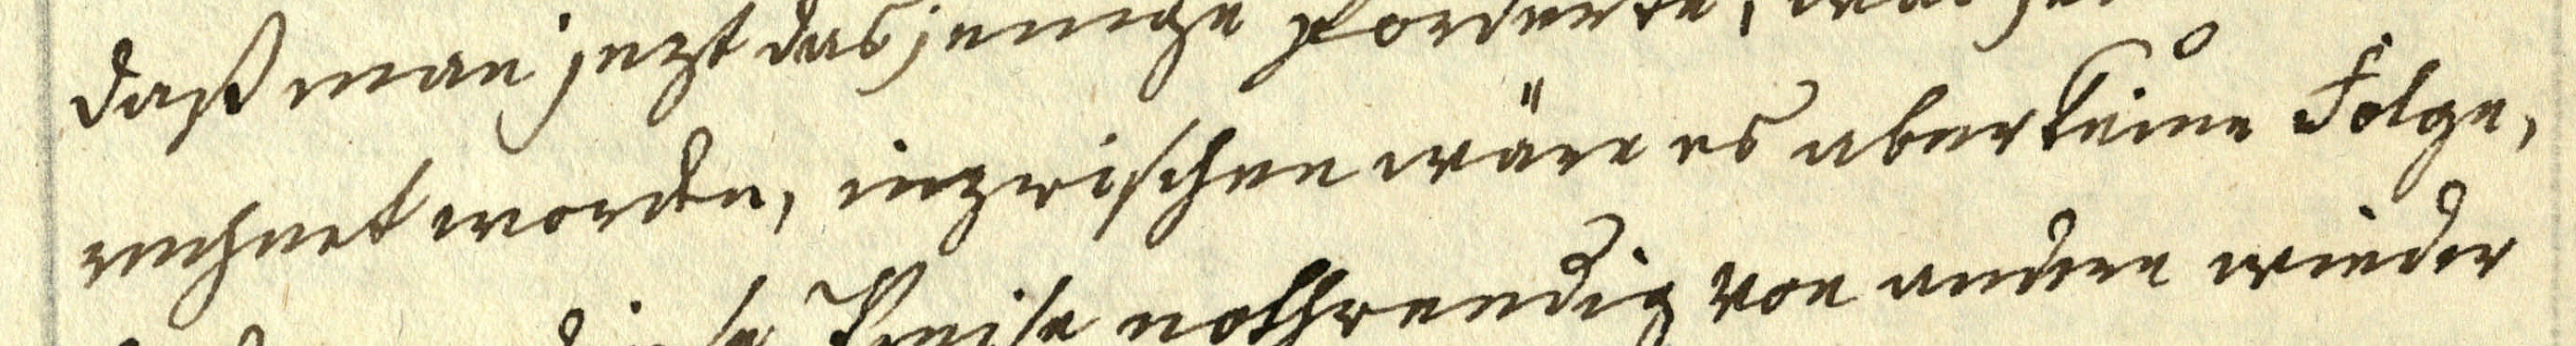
rechnet worden, inzwischen wäre es aber keine Folge,
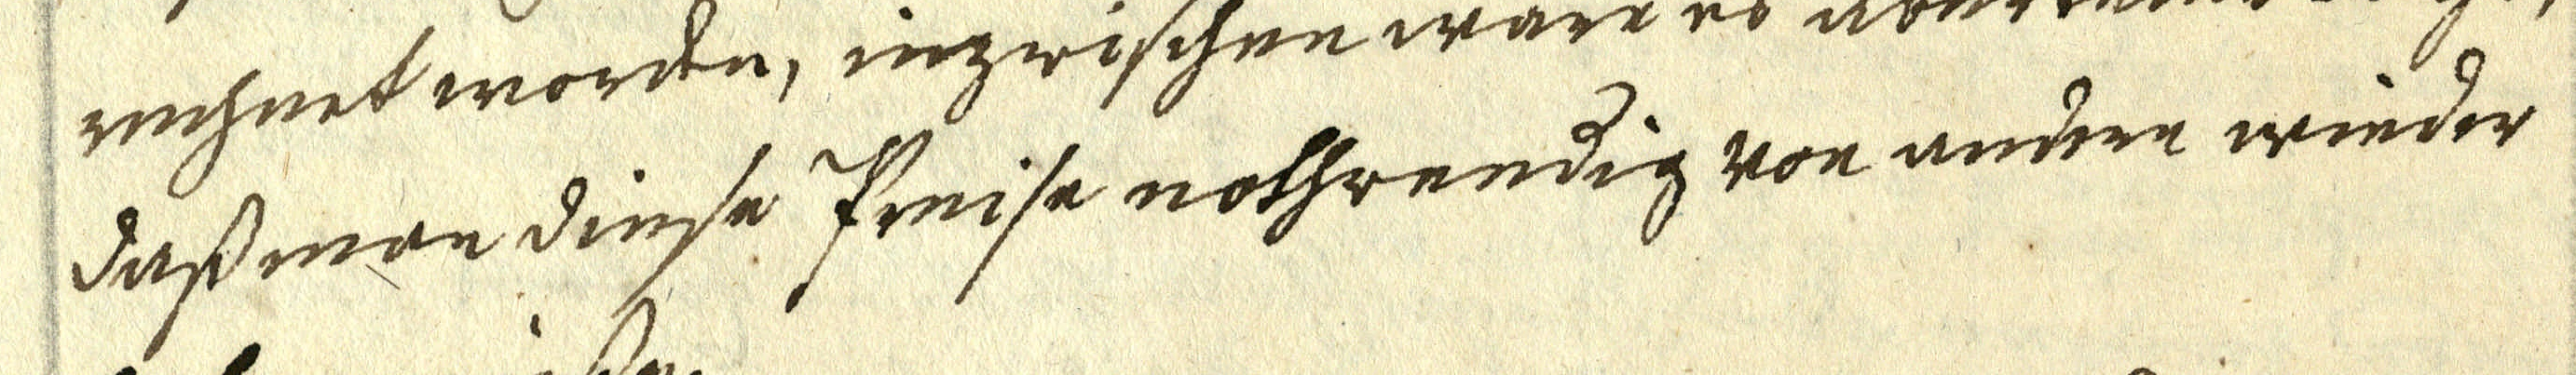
daß man diese Preise nothwendig von andern wieder
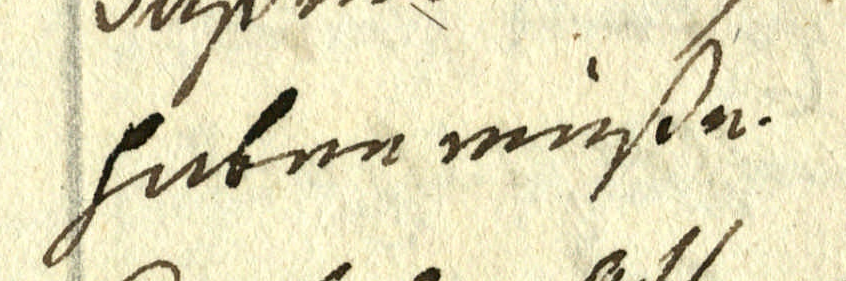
haben müße.
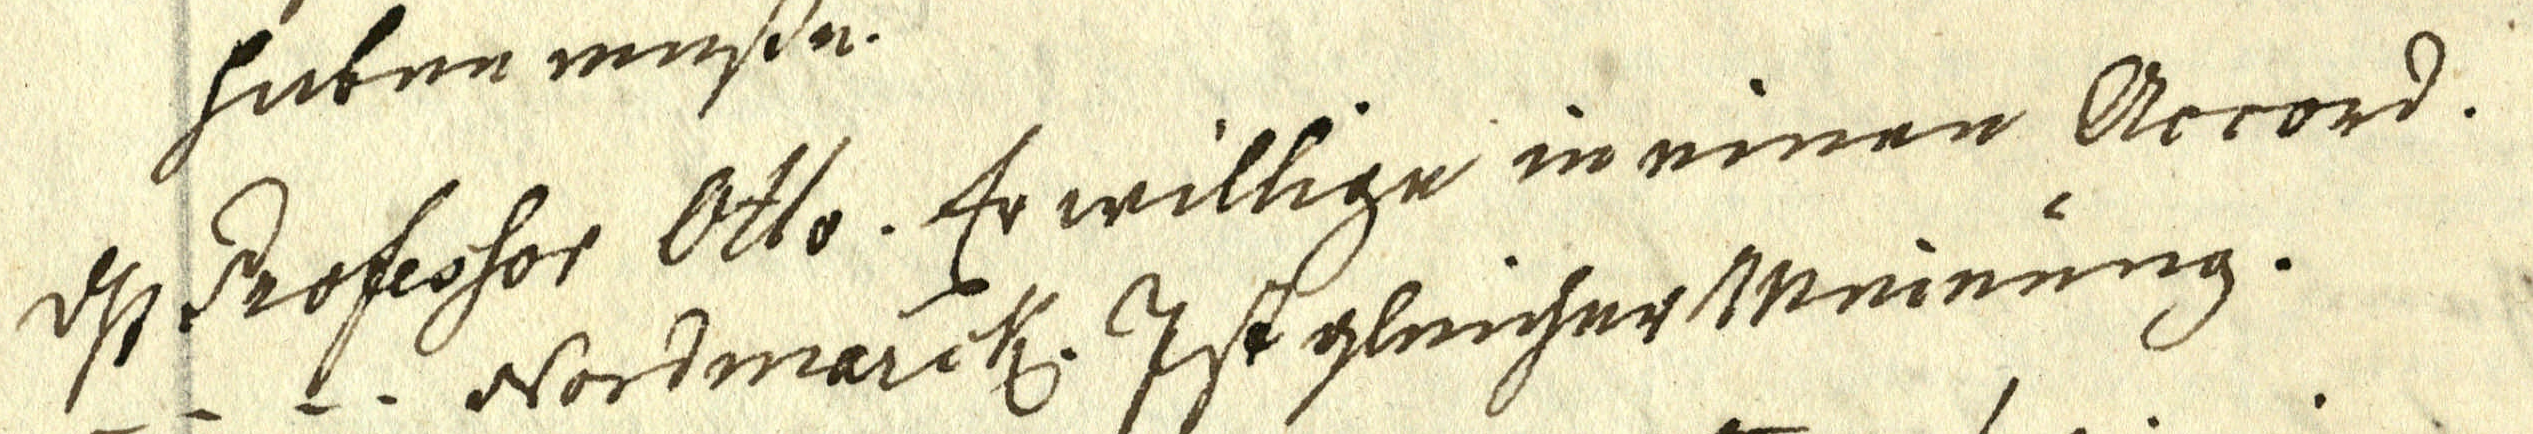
dh Professor Otto. Er willige in einen Accord.
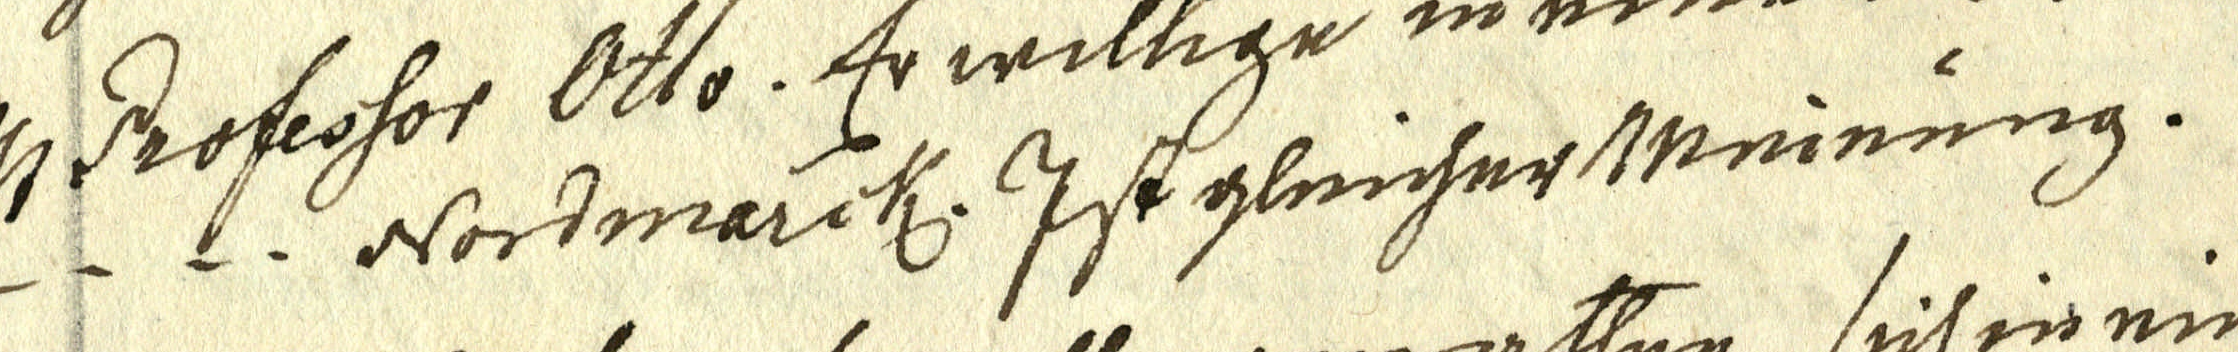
Nordmarck. Ist gleicher Meinung.
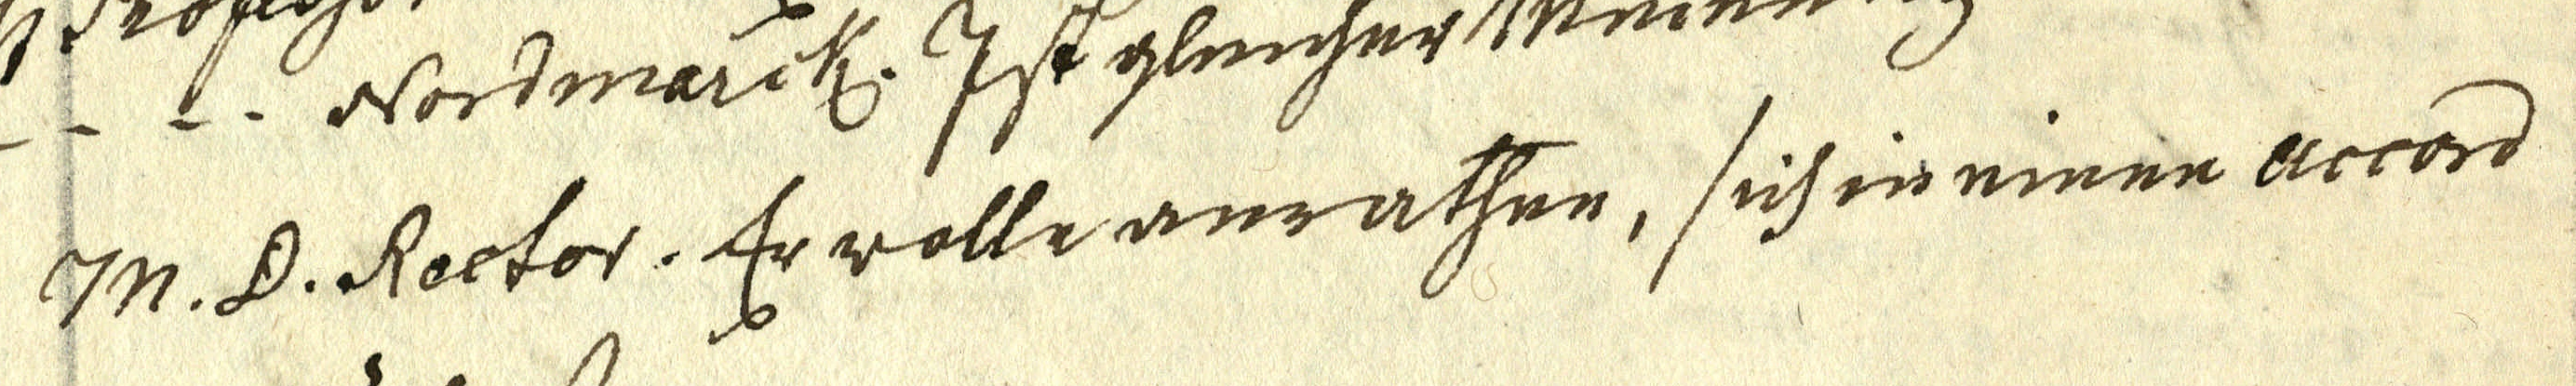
M. D. Rector. Er wolle anrathen, sich in einen Accord
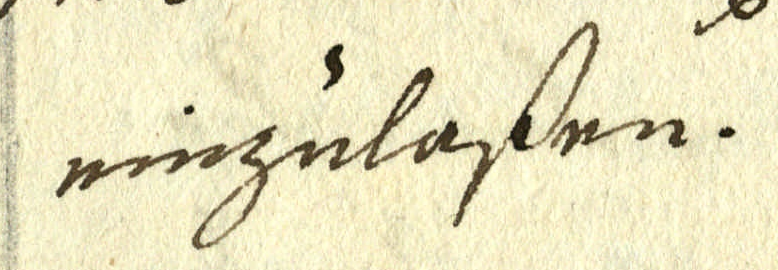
einzulaßen.
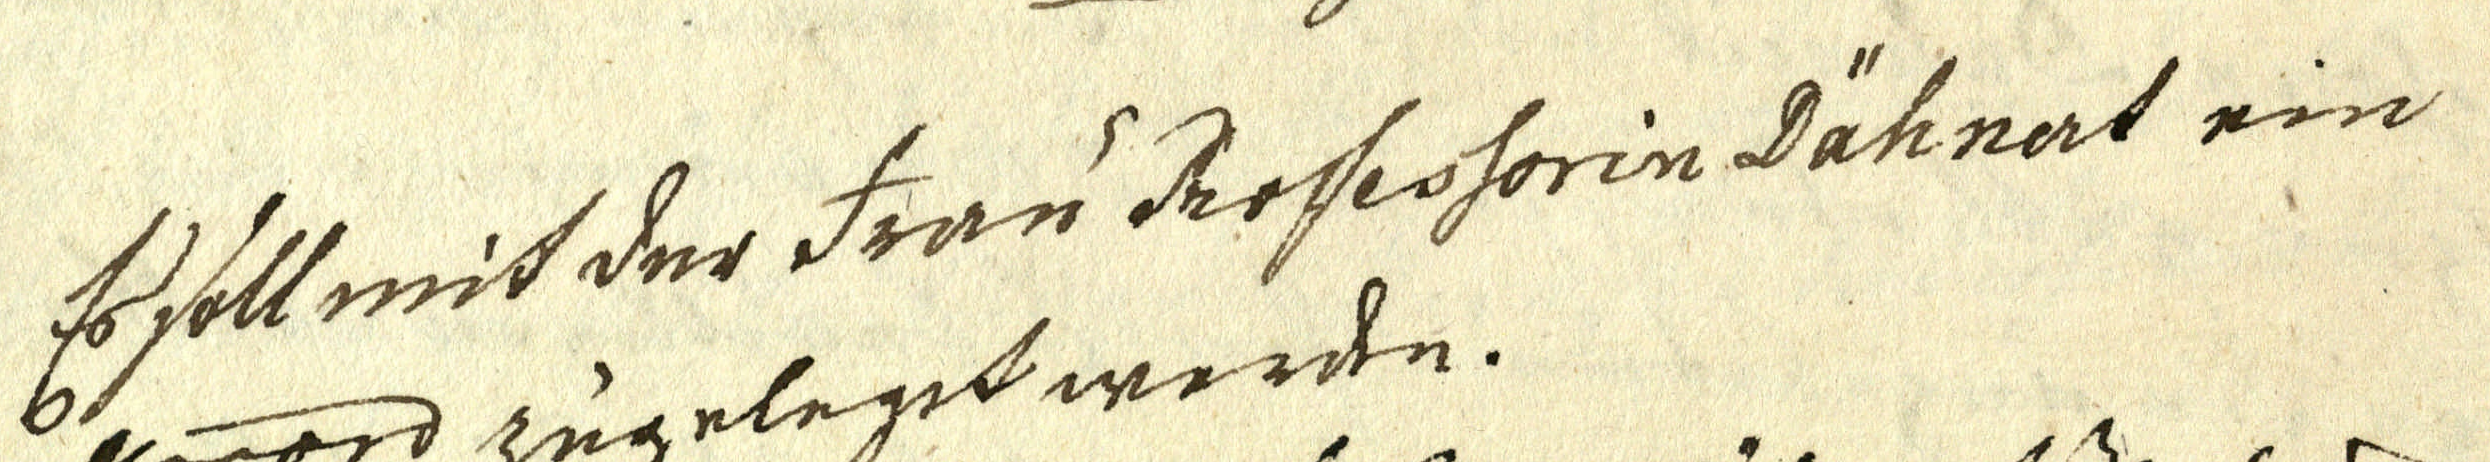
Es soll mit der Frau Professorin Dähnert ein
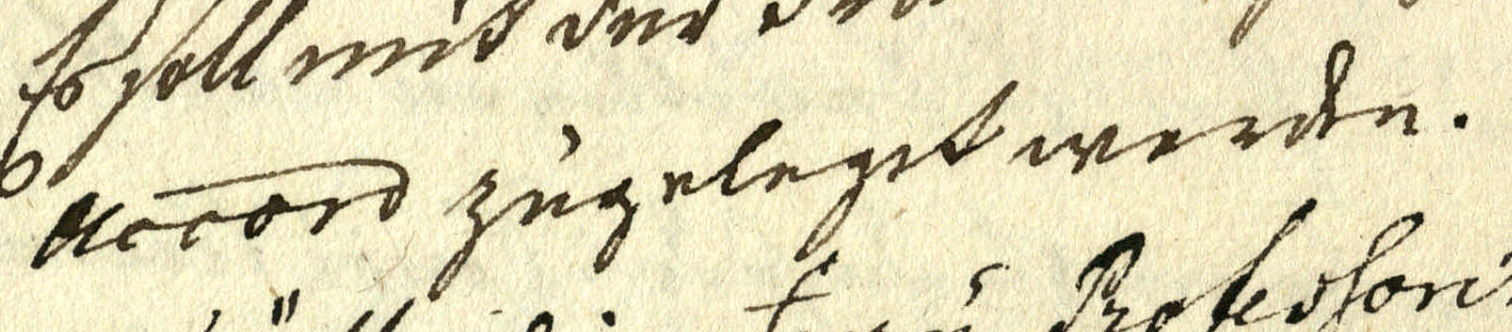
Accord zugeleget werden.
